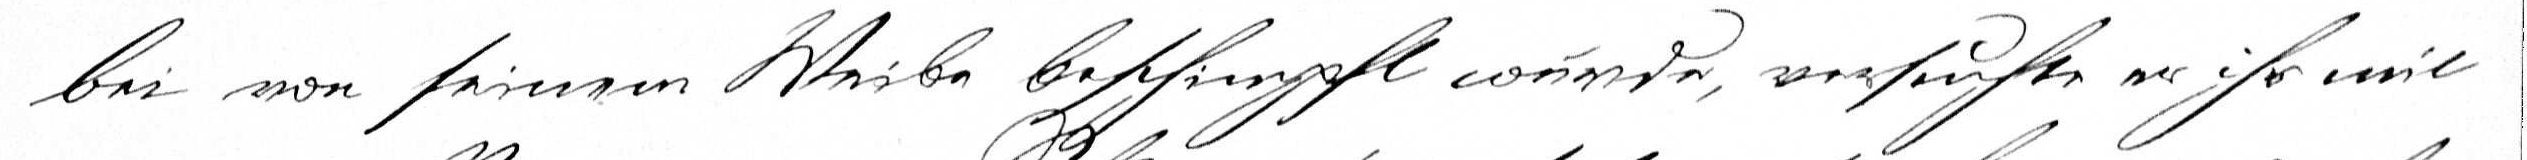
bei von seinem Weibe beschimpft wurde, versuchte er ihr mit
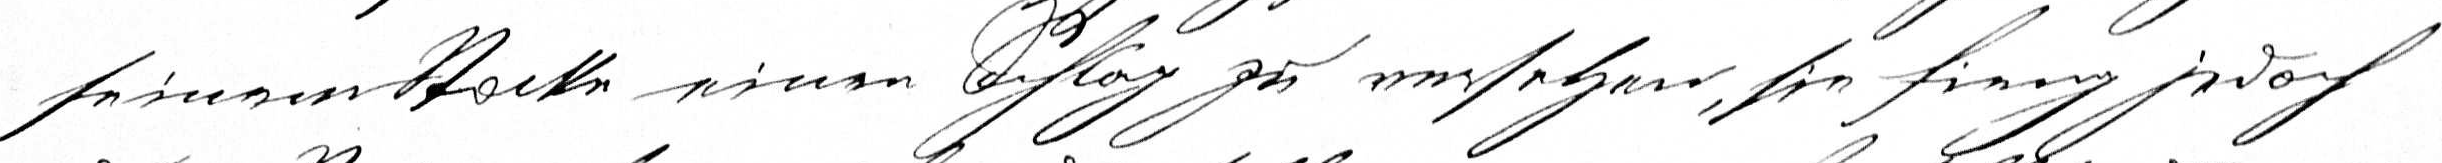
seinem Stocke einen Schlag zu versetzten, sie fieng jedoch
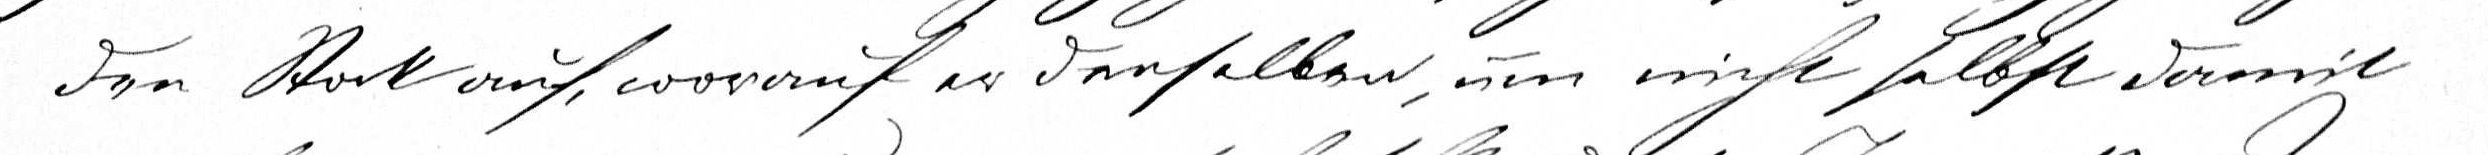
den Stock auf, worauf er denselben, um nicht selbst damit
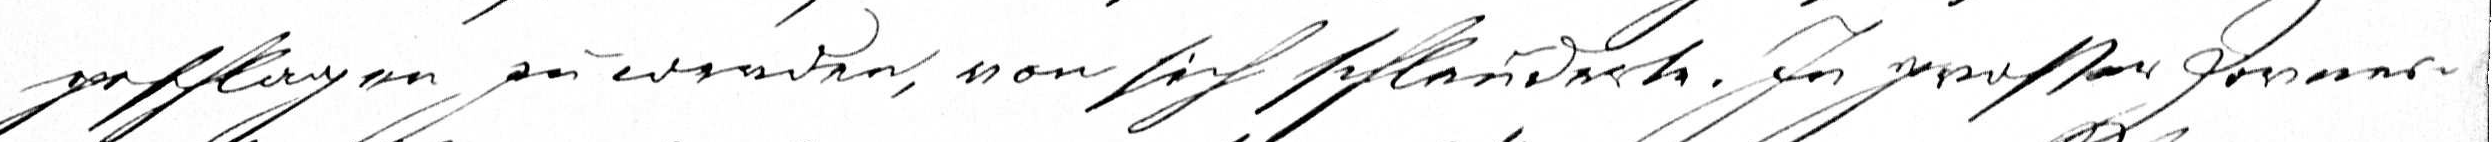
geschlagen zu werden, von sich schleuderte. In großer Zornes¬
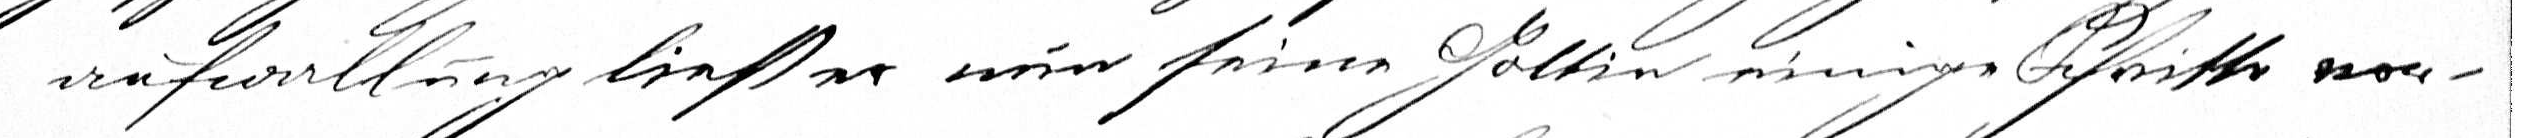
aufwallung ließ er nun sene Gattin einige Schritte vor¬
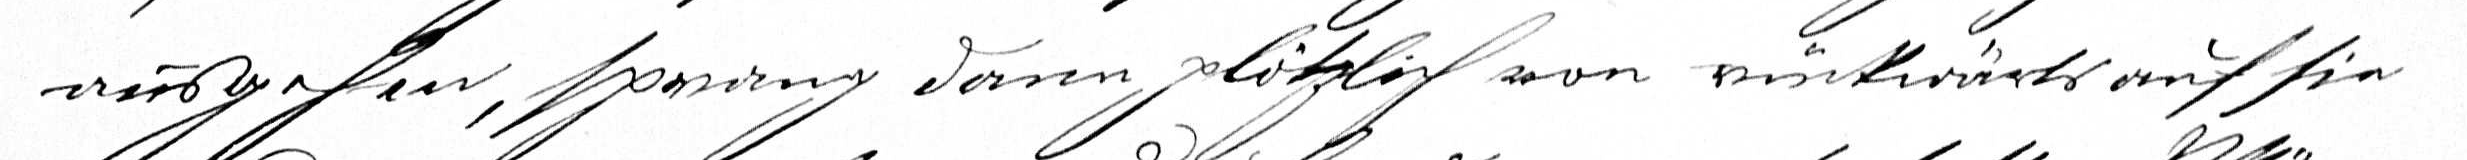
ausgehen, sprang dann plötzlich von rückwärts auf sie
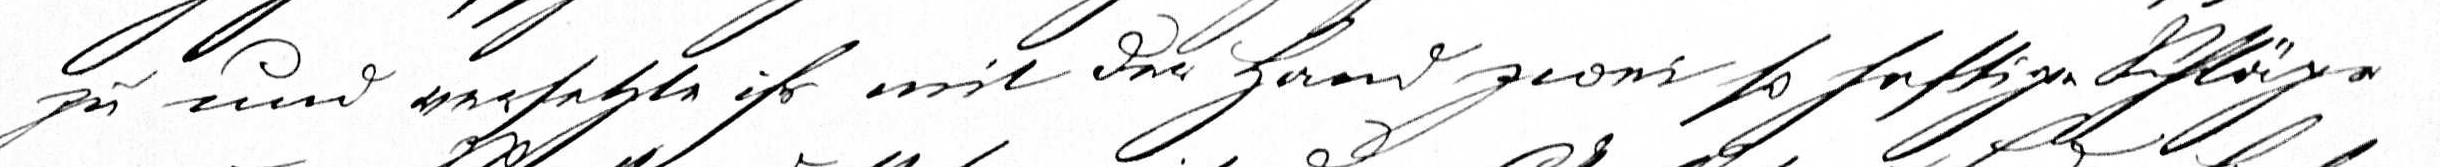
zu und versetzte ihr mit der Hand zwei so festige Schläge
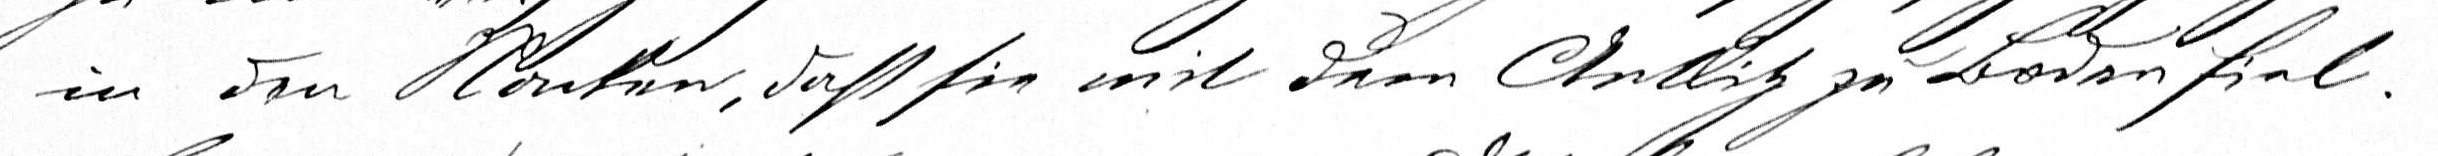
in den Nacken, daß sie mit dem Antlitz zu Boden fiel.
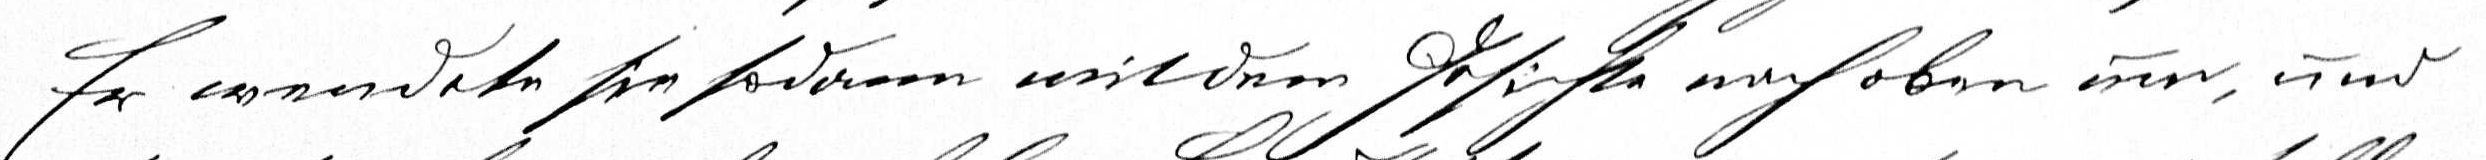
Er wendete sie sodann mit dem Gesichte nach oben um, und
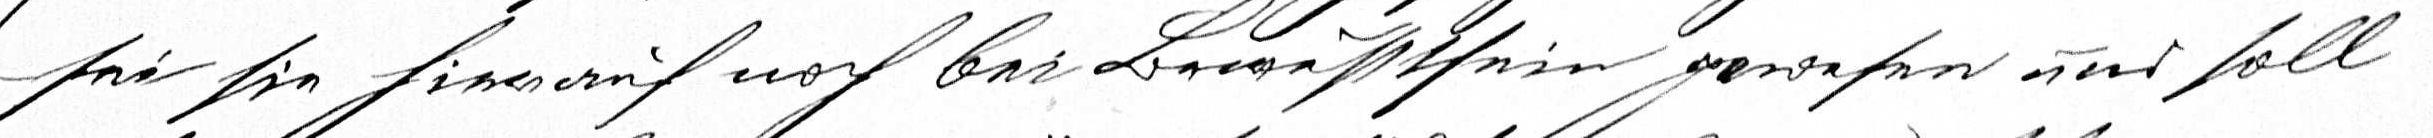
sei sie hierauf noch bei Bewußtsein gewesen und soll
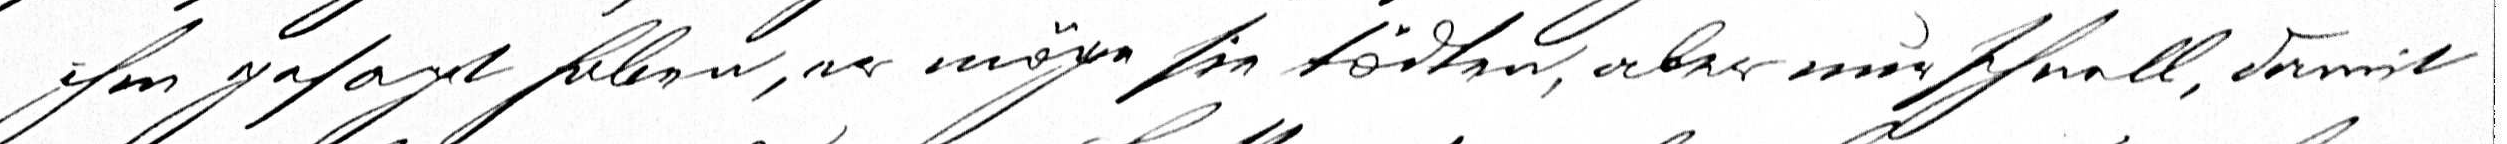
ihm gesagt haben, er möge sie tödten, aber nur schnell, damit
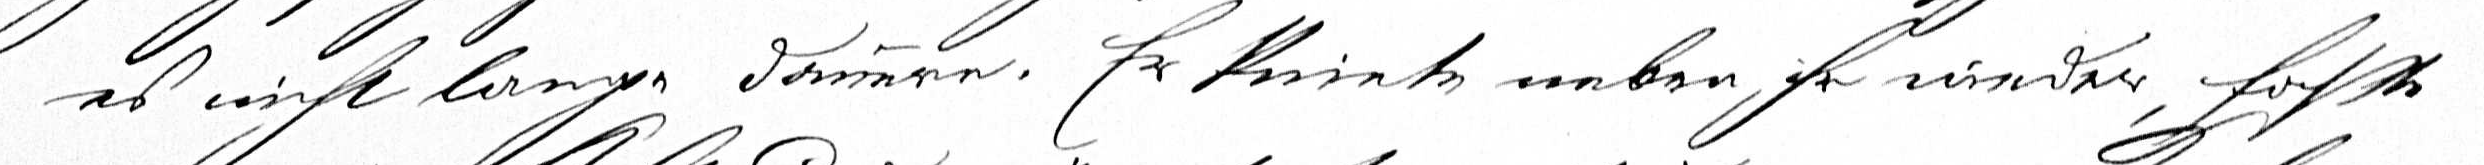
es nicht lange dauere. Er kniete neben ihr wieder, faßte
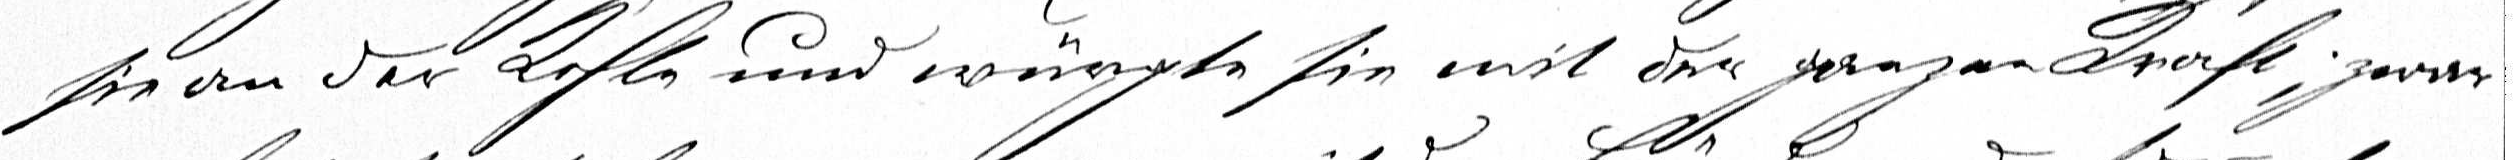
sie an der Kehle und würgte sie mit der ganzen Kraft, zwar
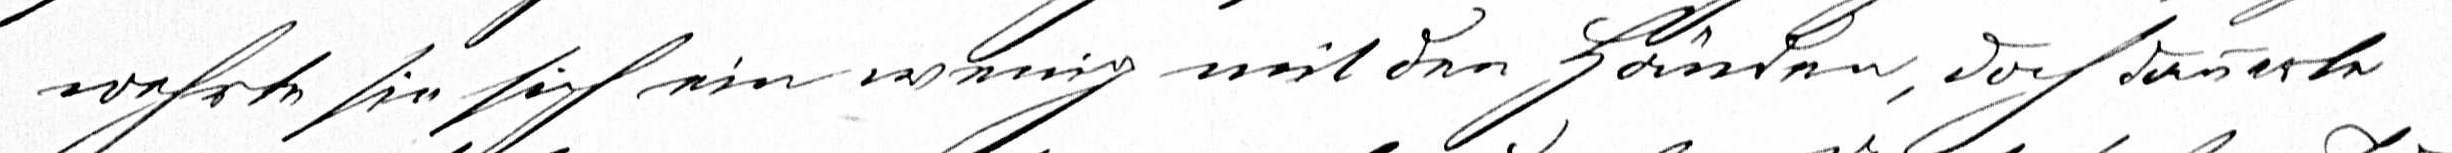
wehrte sie sich ein wenig mit den Händen, doch dauerte
